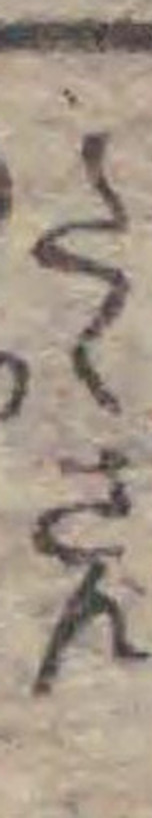たくさん
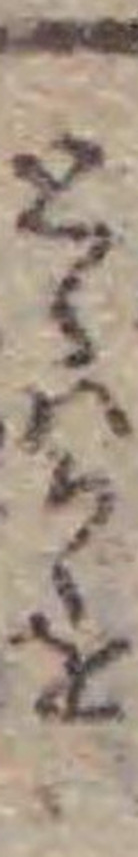とゝはかゝを
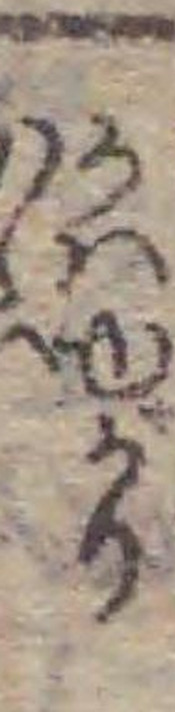かわゆがり
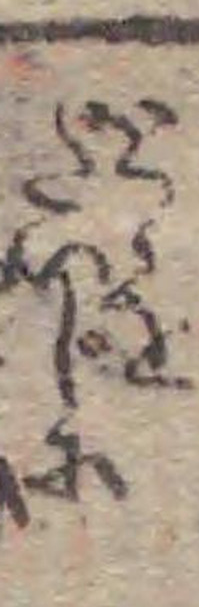だいじに
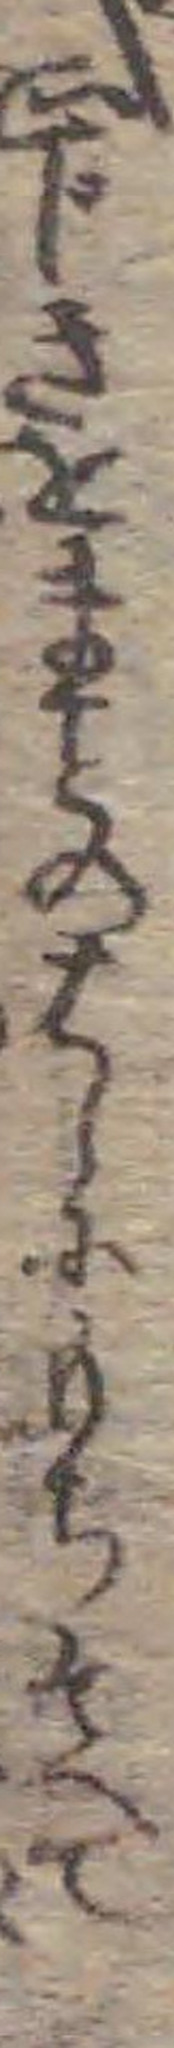〽正じきをまことのはしにもちそへて
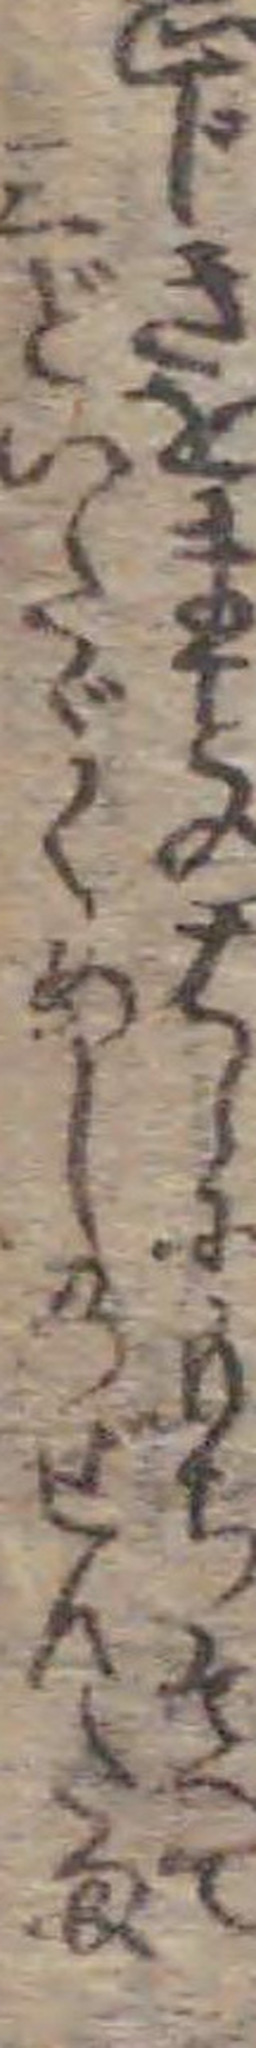三どいたゞくめしのぜんたま
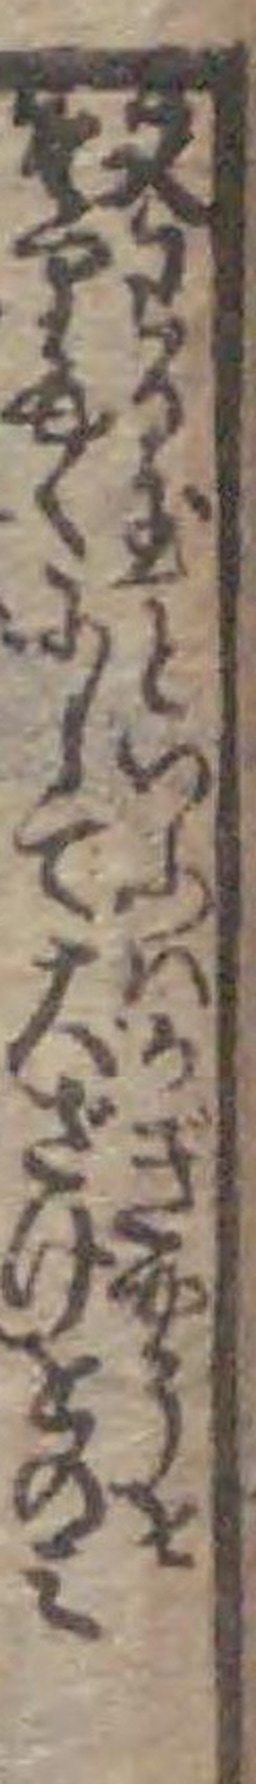そりやくにして大ざけをのみ
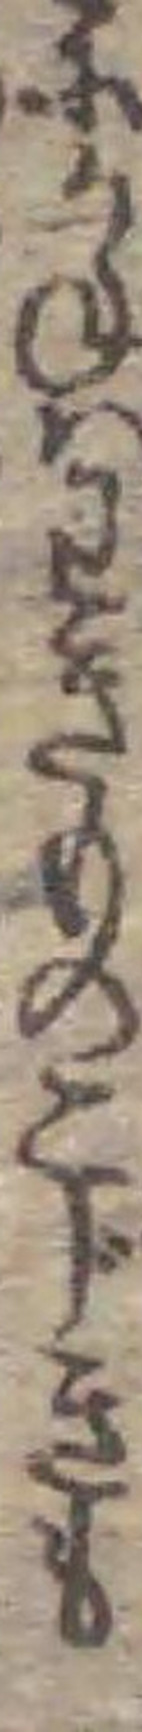せにかねはわきものこじきも
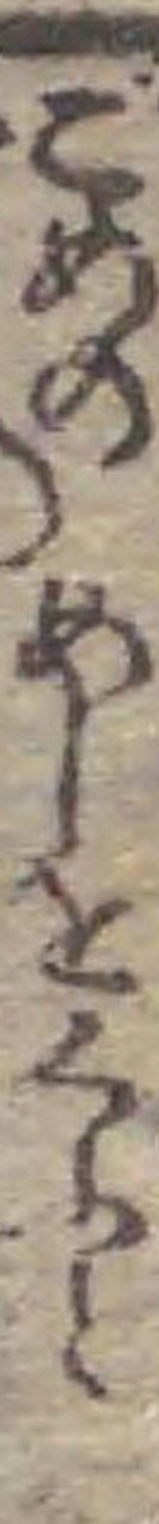こめのめしをくふと
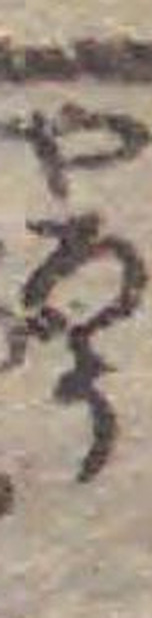やろう
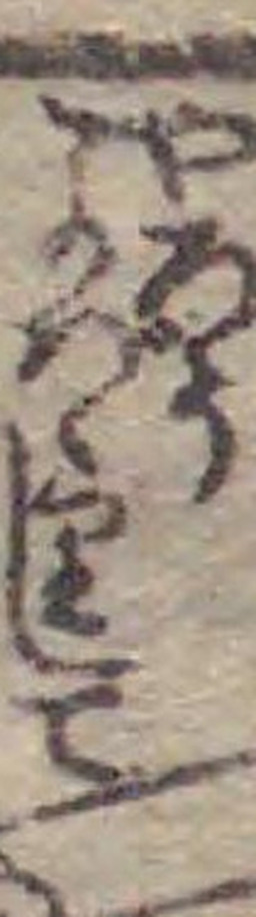よはゝりして
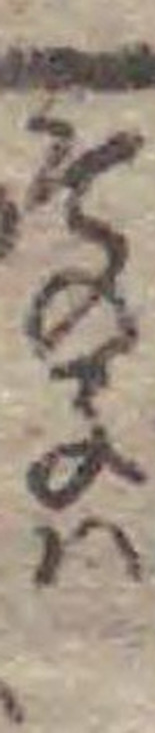その子は
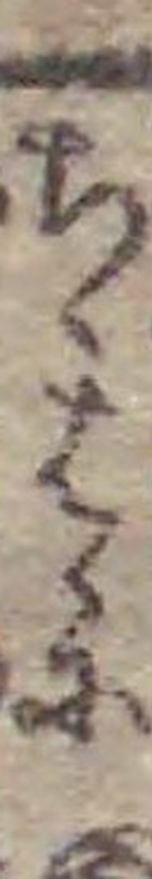ちゝはゝに
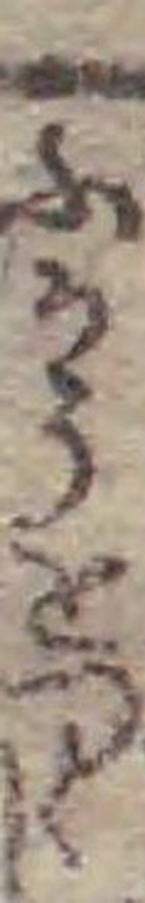ふかうをつくし
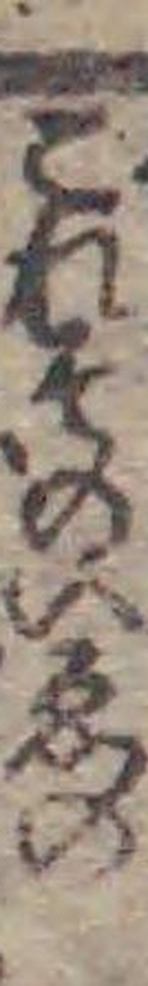これそのいゑの
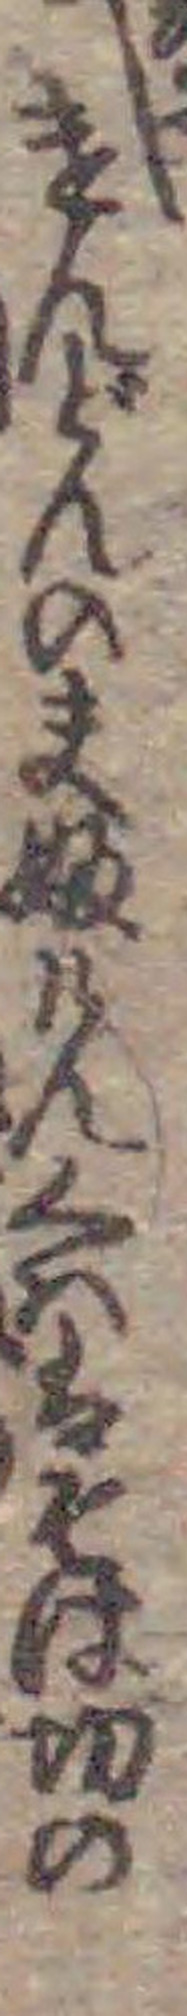〽けんどんの夫婦けんくはそは切の
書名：四遍搨心学草帋 : 3巻
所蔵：国立国会図書館 National Diet Library, JAPAN
